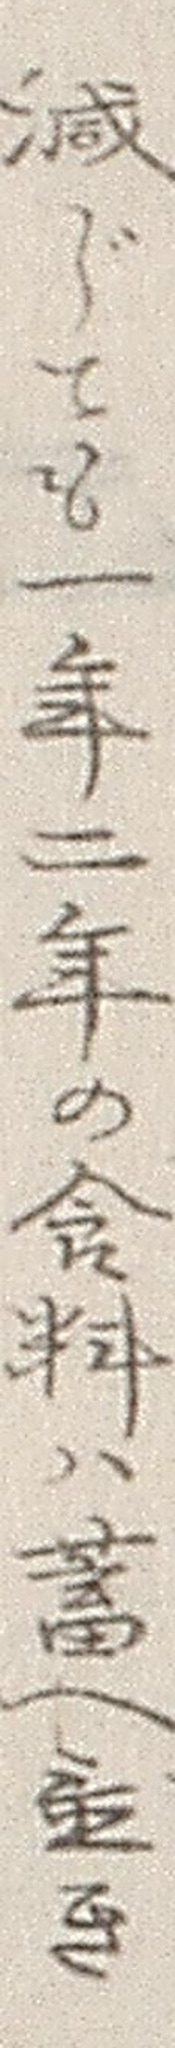減じても一年二年の食料は蓄へ置き
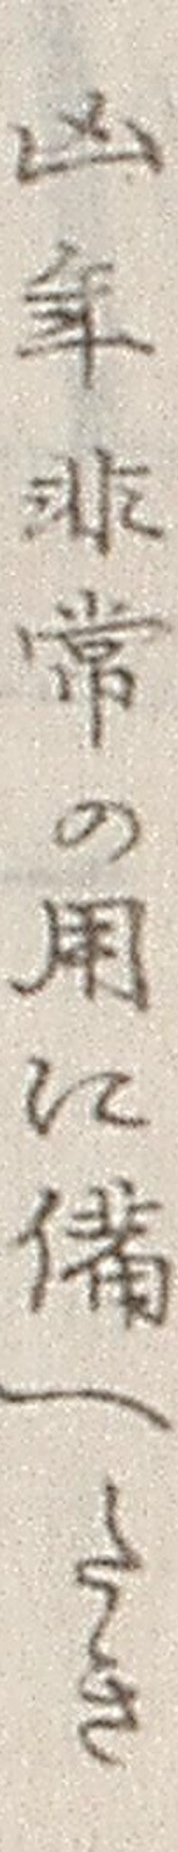凶年非常の用に備へたき
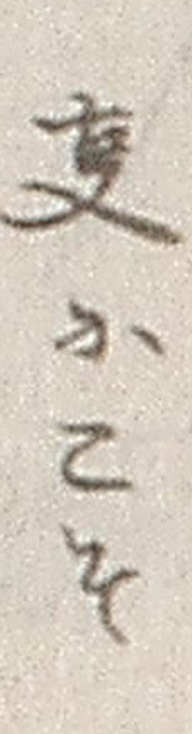事にこそ

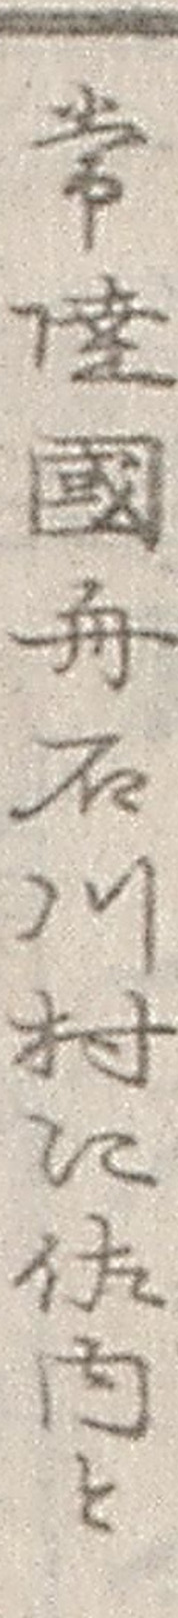常陸国舟石川村に佐内と
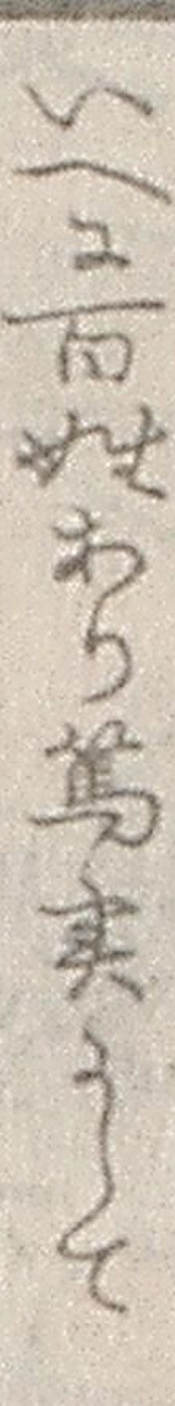いへる百姓あり篤実にして
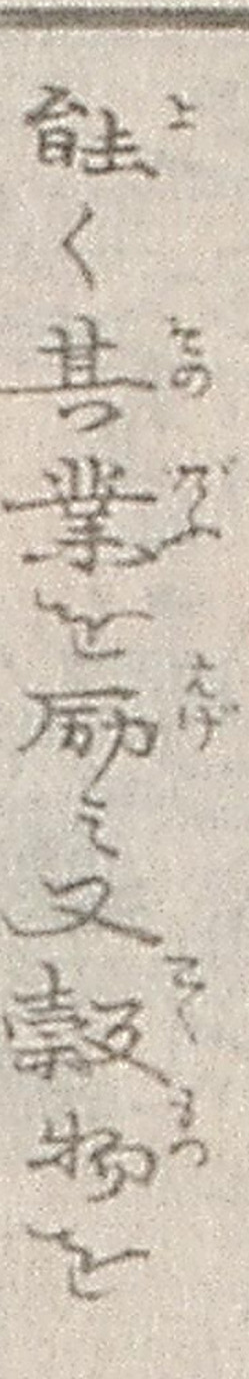能く其業を励み又穀物を
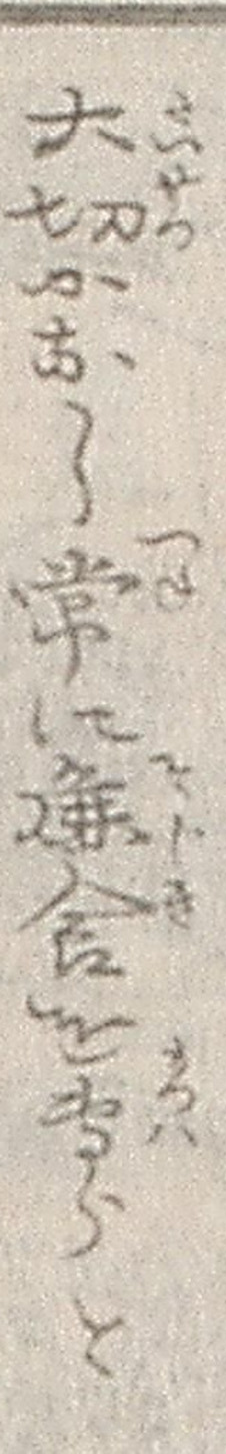大切になし常に麁食を専らと
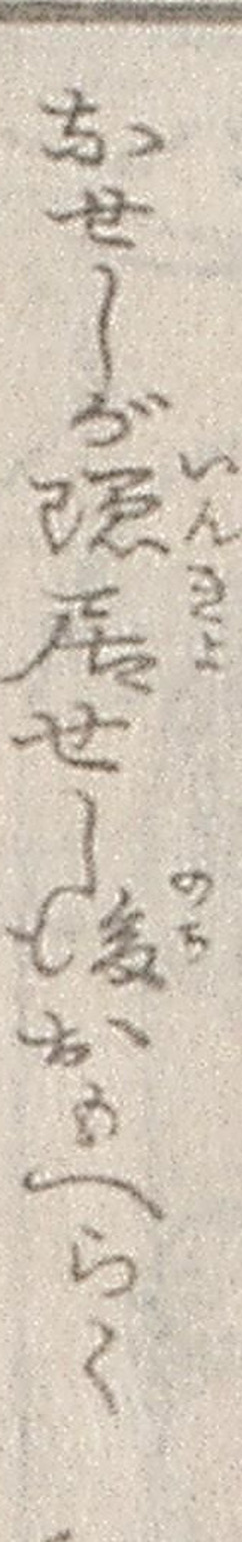なせしが隠居せし後おもへらく
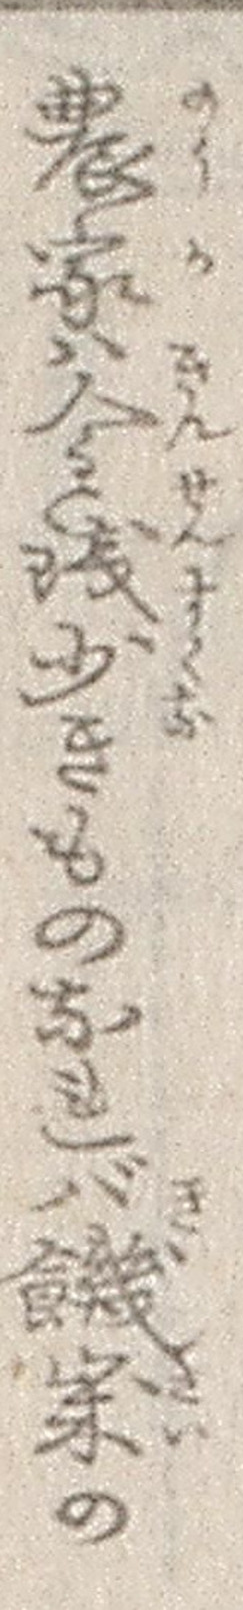農家は金銭少きものなれば饑歳の
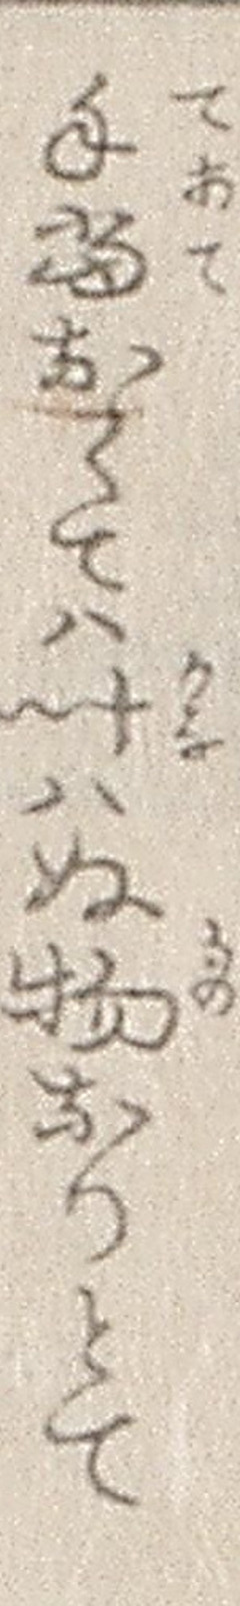手当なくては叶はぬ物なりとて
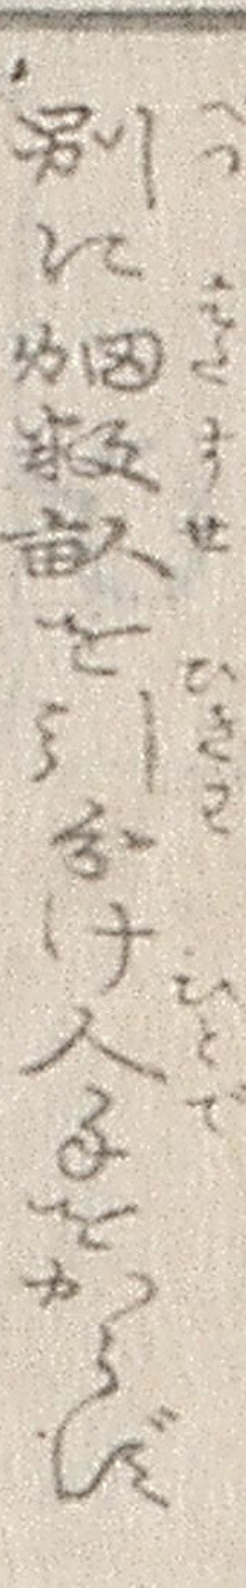別に畑数畝を引分け人手をからず
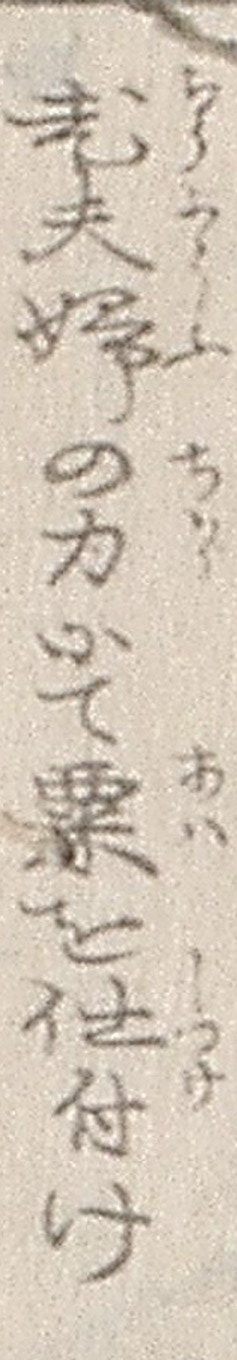老夫婦の力にて粟を仕付け
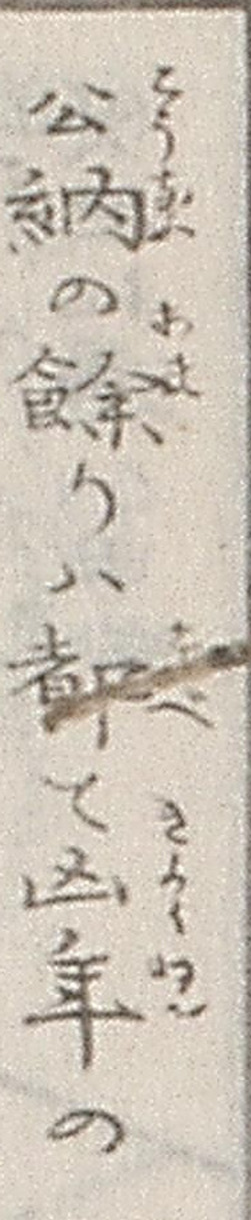公納の余りは都て凶年の
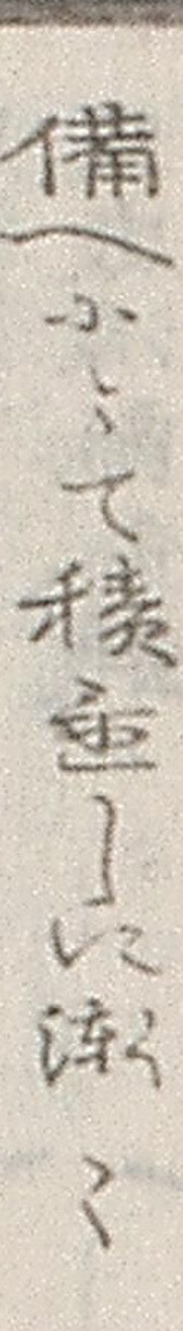備へにとて積置しに漸〻
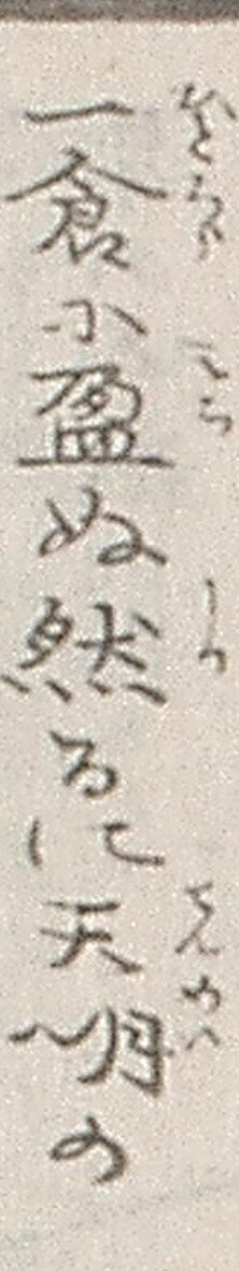一倉に盈ぬ然るに天明の
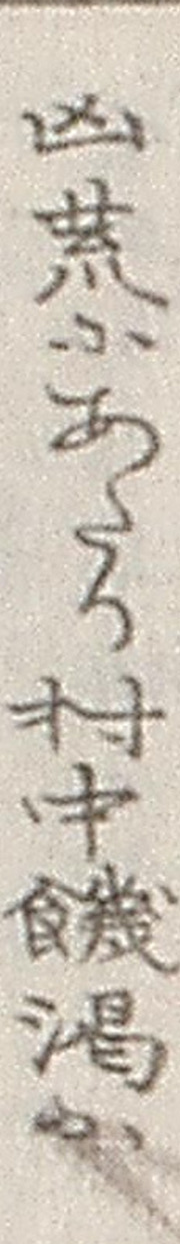凶荒にあたり村中饑渇に
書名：凶荒図録　完
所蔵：東京大学地震研究所図書室 Earthquake Research Institute Library, The University of Tokyo, JAPAN
